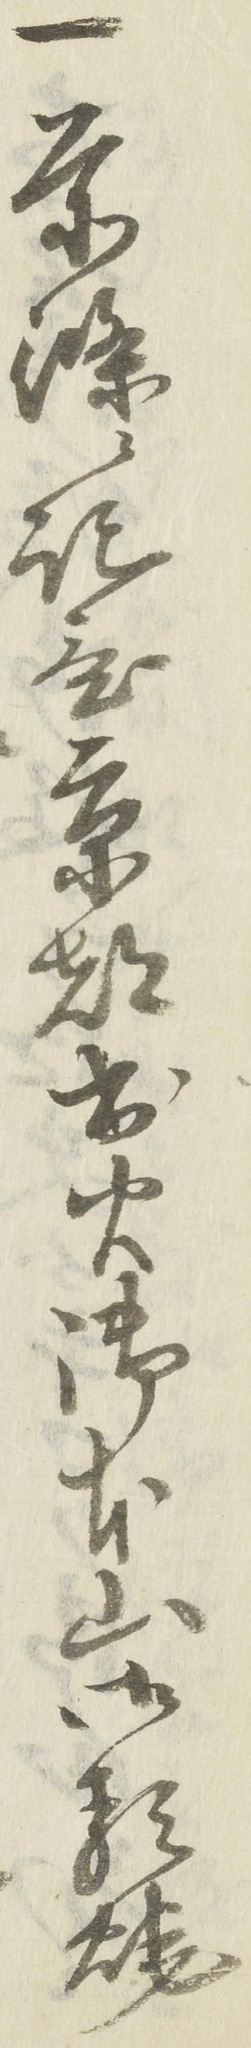一前条ニ記置京都出火御本山類焼
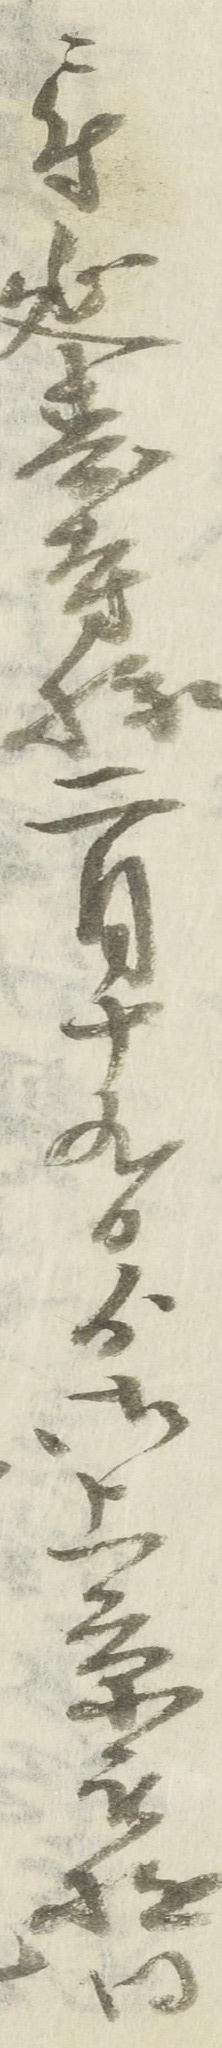ニ付延寿寺様二月十九日ゟ御上京被遊同
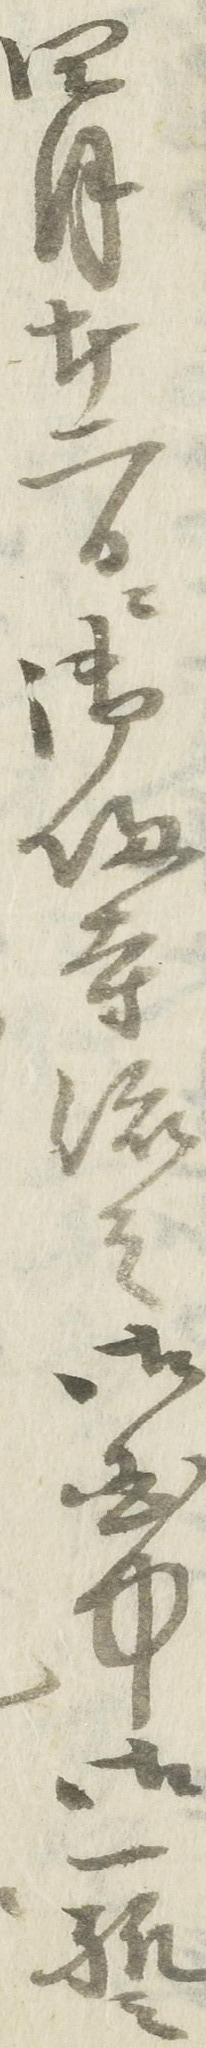四月廿弐日ニ御帰寺依之御国中御一統之
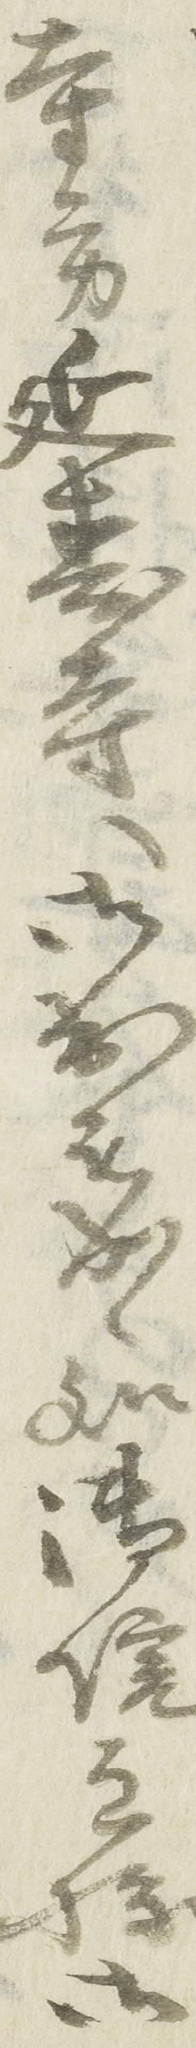寺方延寿寺へ御出被成候処御院主様御
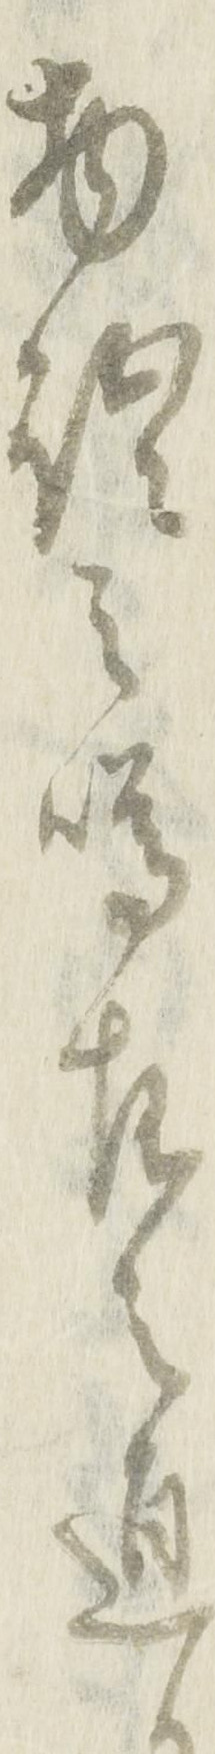物語の噂左之通り
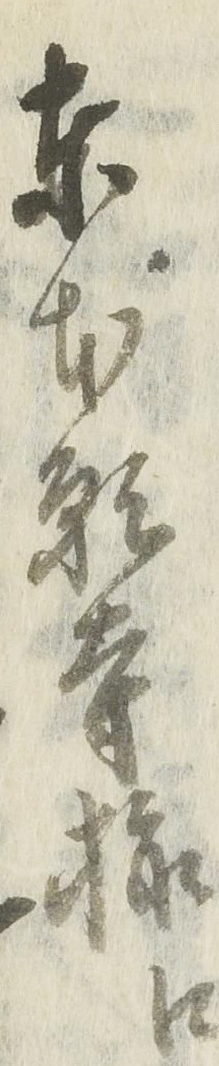東本願寺様え
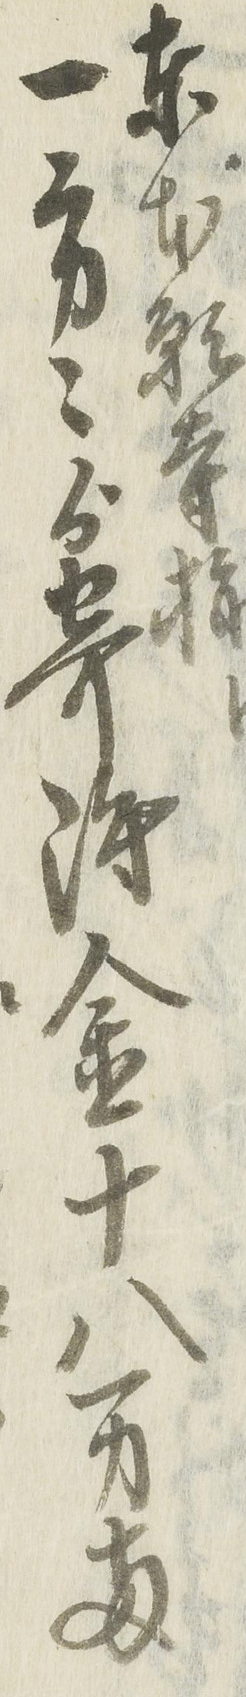一方〻ゟ寄附金十八万両
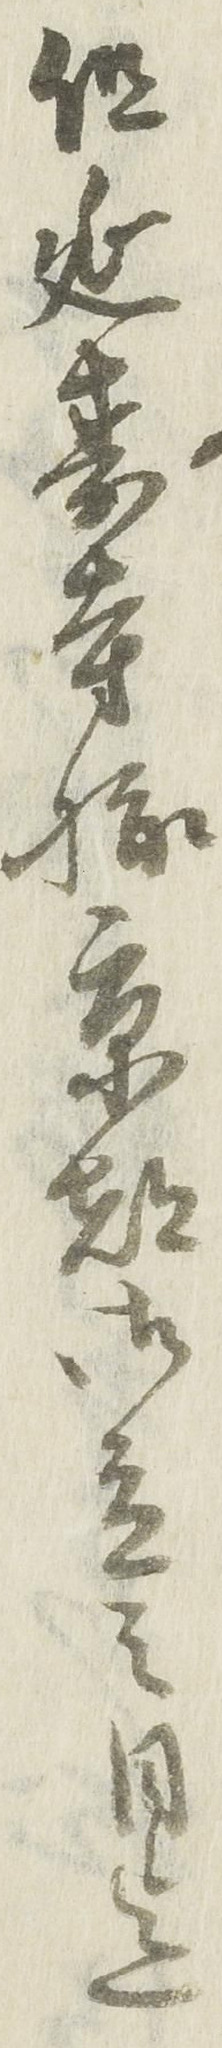但延寿寺様京都御立之日迄
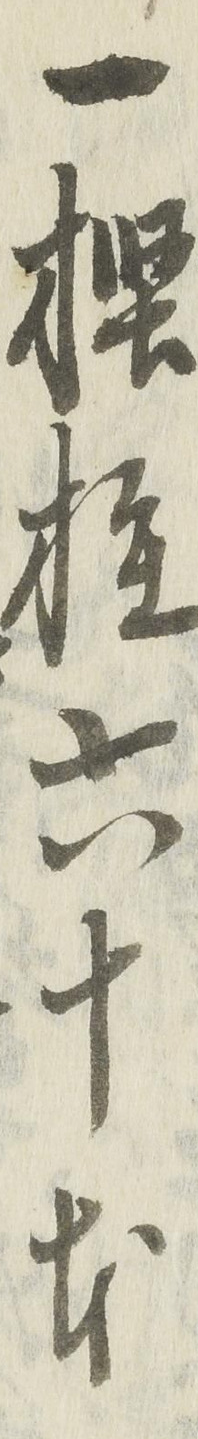一樫柱六十本
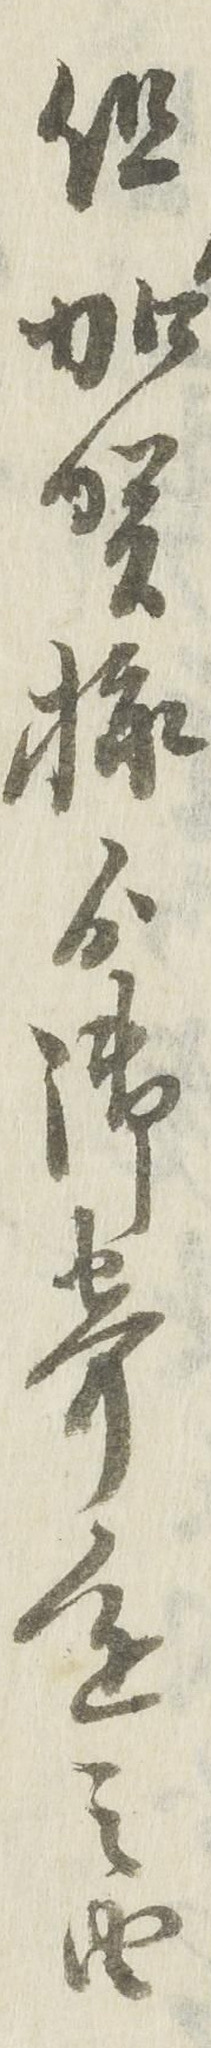但加賀様ゟ御寄進之由
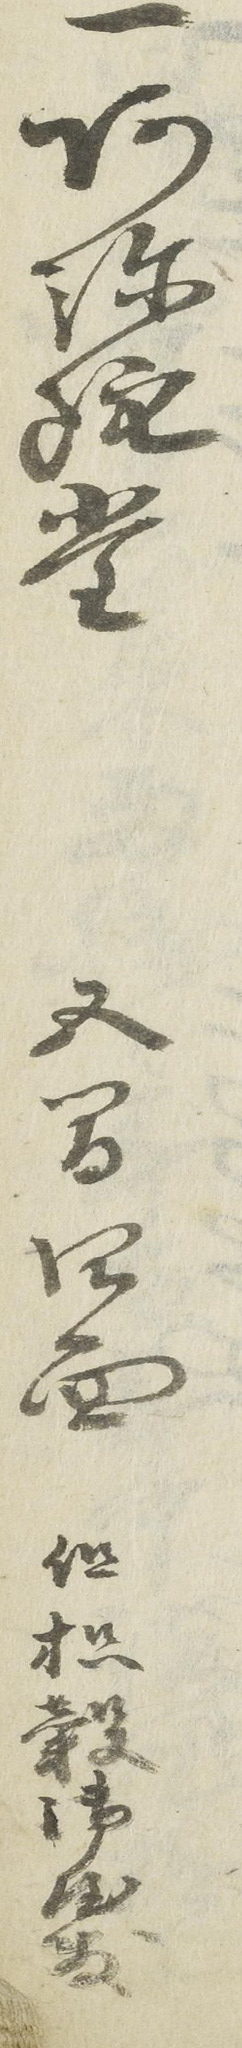一阿弥陀堂五間四面但枳殻御屋敷

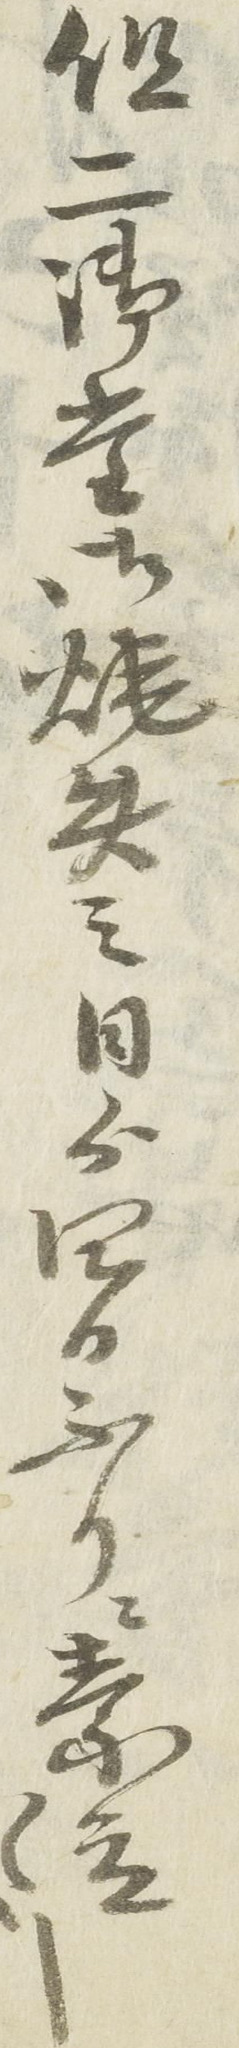但ニ御堂御焼失之日ゟ四日ふりニ素立いたし
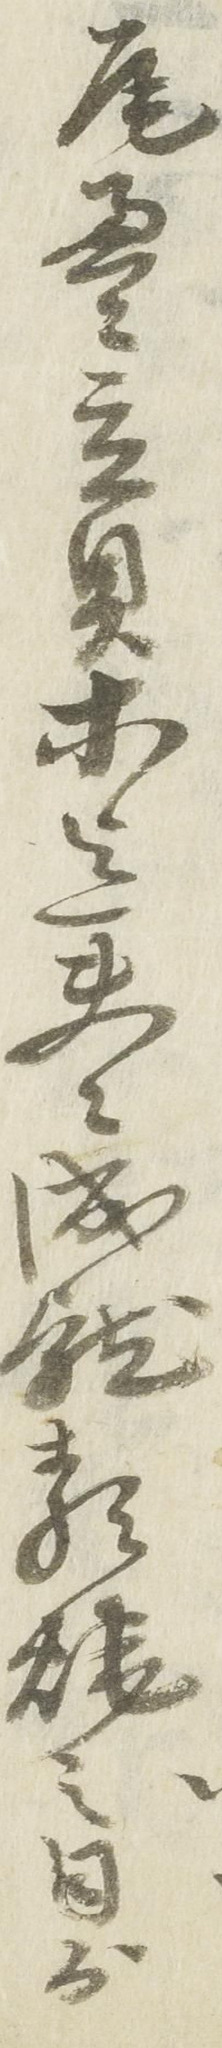瓦畳立具等迄夫〻成就類焼之日ゟ
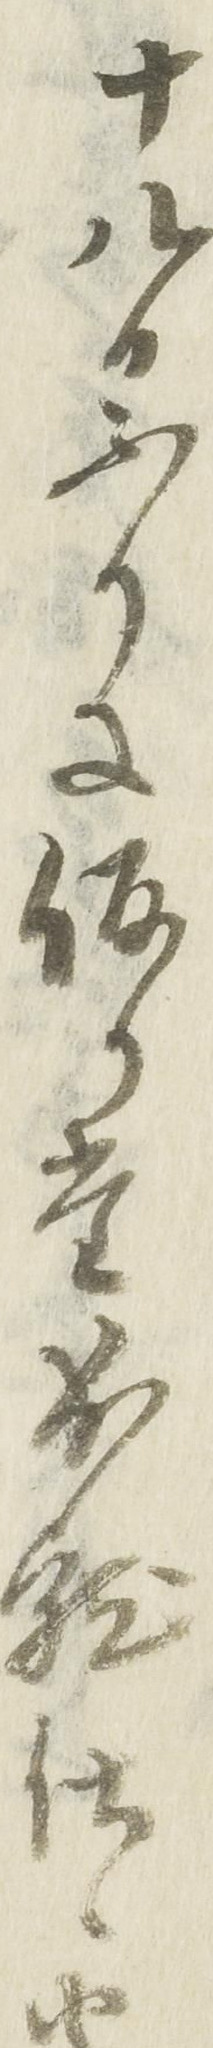十八日ふりに仮り堂成就仕候由
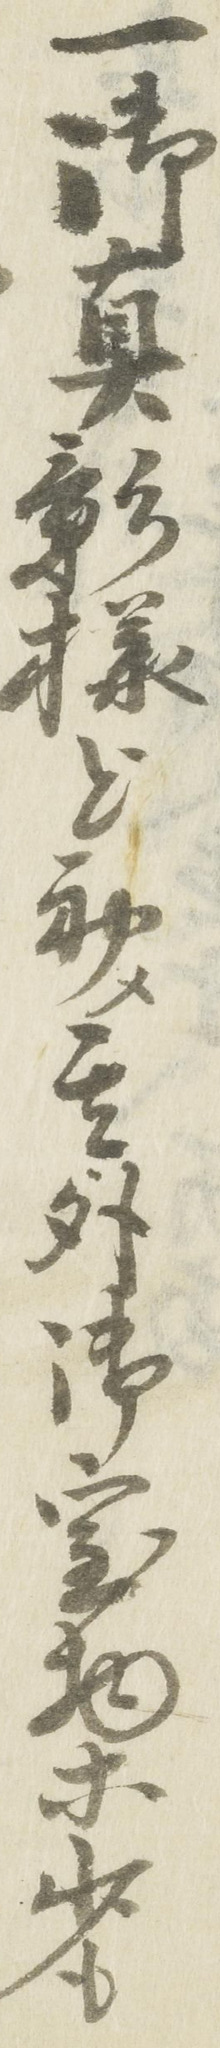一御真影様を初メ其外御宝物等少も
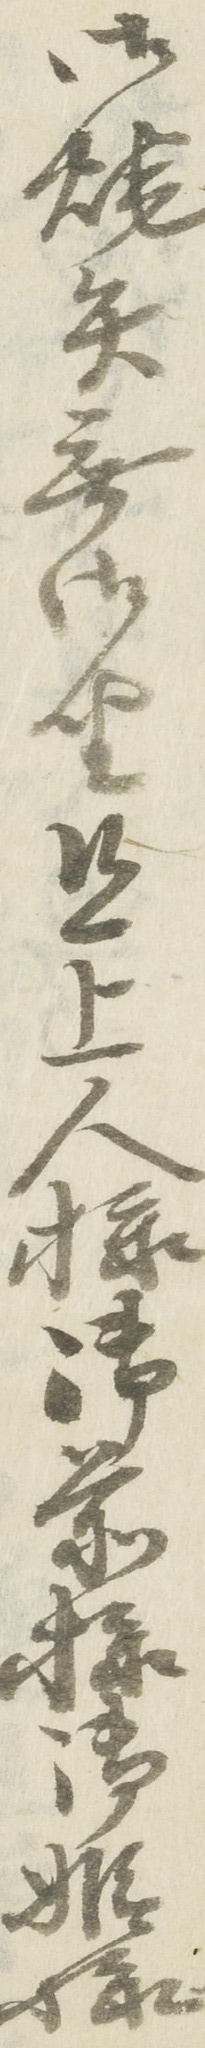御焼失無御坐且上人様御前様御姫様
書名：後見笑
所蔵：東京大学地震研究所図書室 Earthquake Research Institute Library, The University of Tokyo, JAPAN
